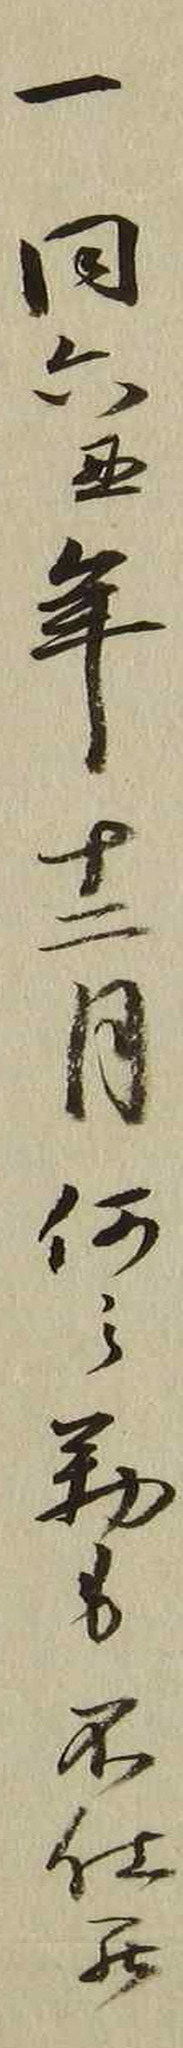一同六丑年十二月何之勤も不仕罷
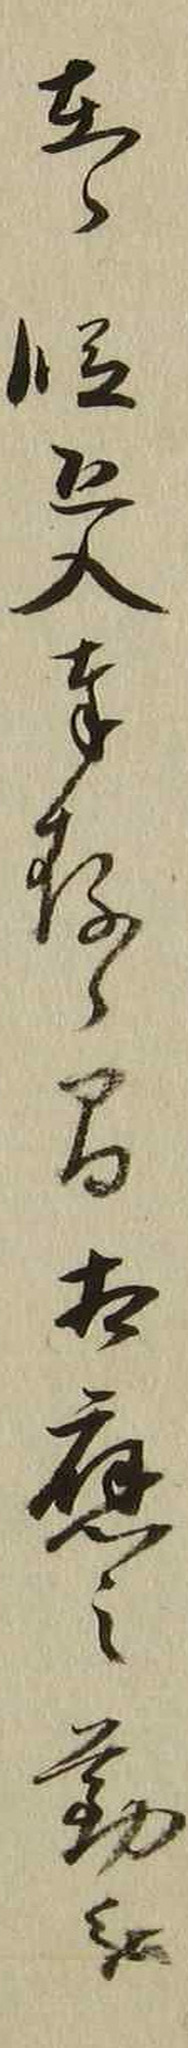在候段恐入奉存候間相応之勤被
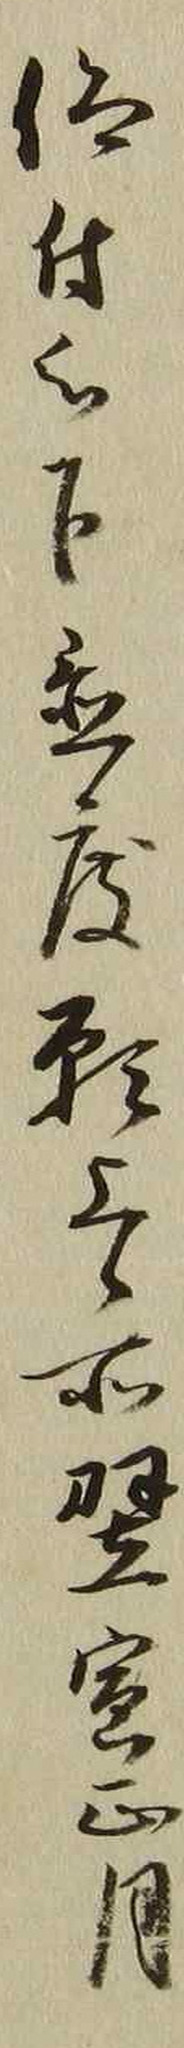仰付被下置度願上候所翌寅正月
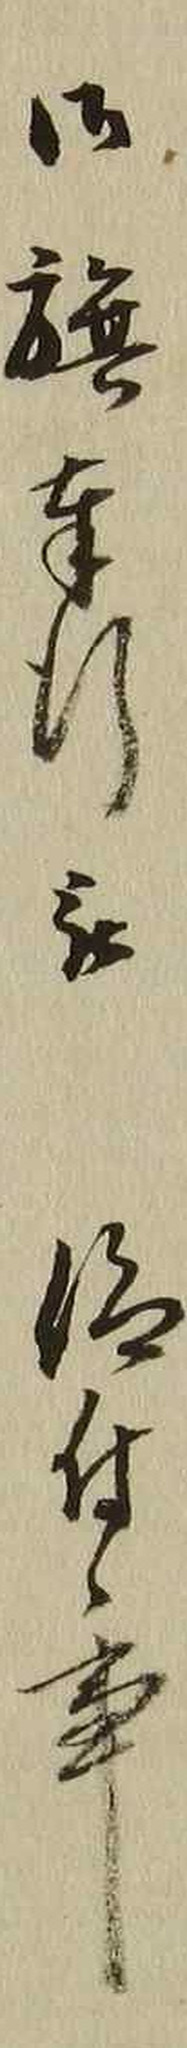御旗奉行被仰付候事
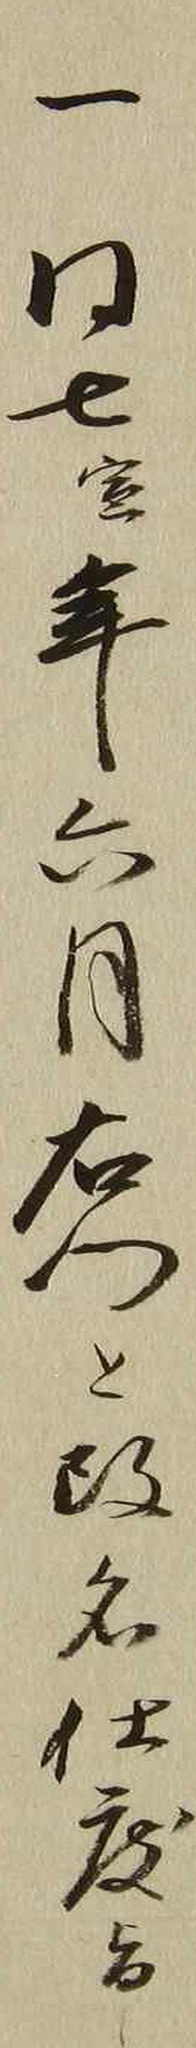一同七寅年六月右門と改名仕度旨
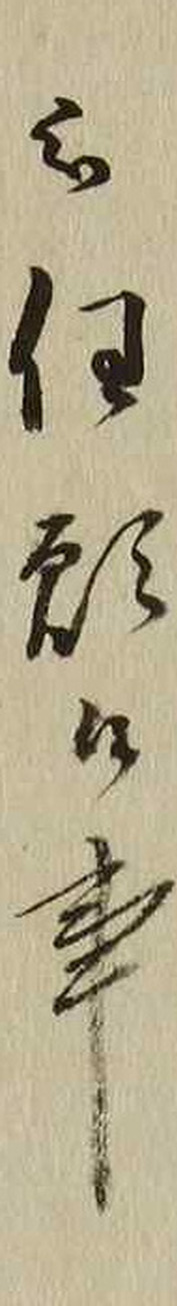被任願候事
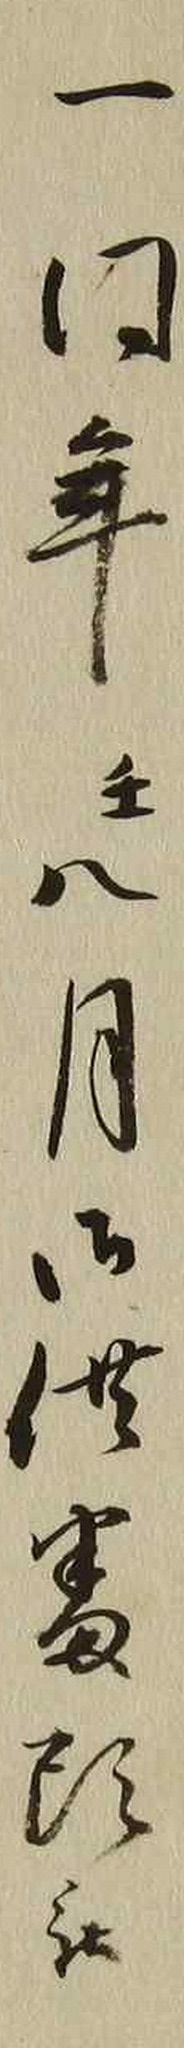一同年閏八月御供番頭被
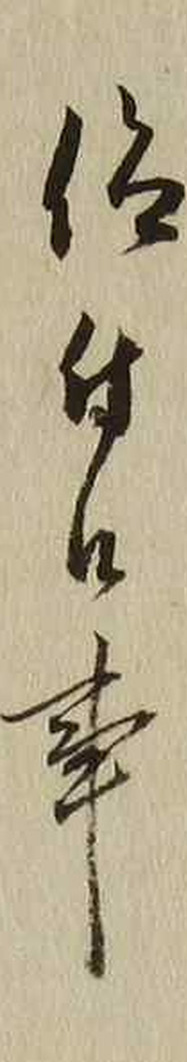仰付候事
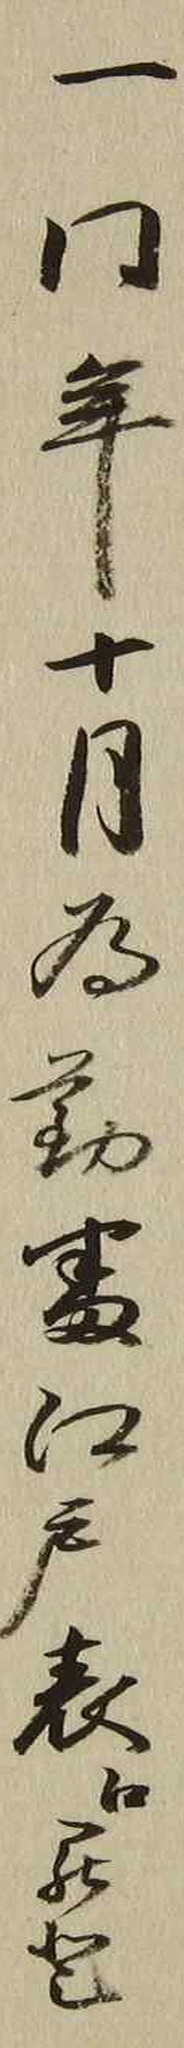一同年十月為勤番江戸表江罷登
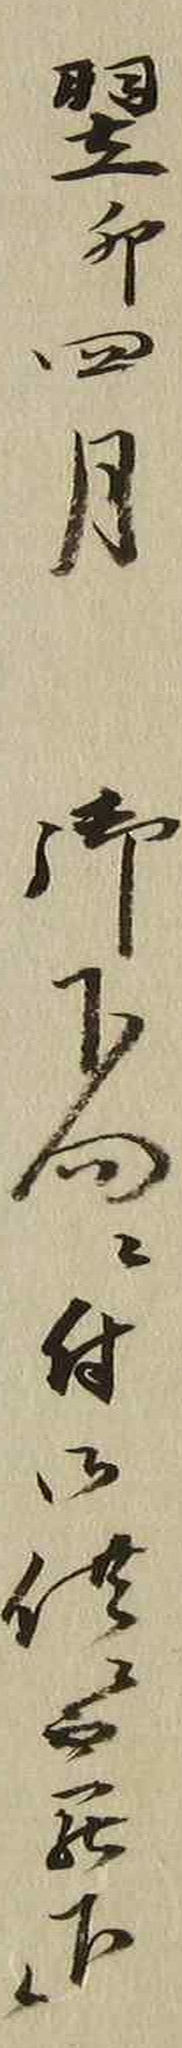翌卯四月御下向ニ付御供ニ而罷下候
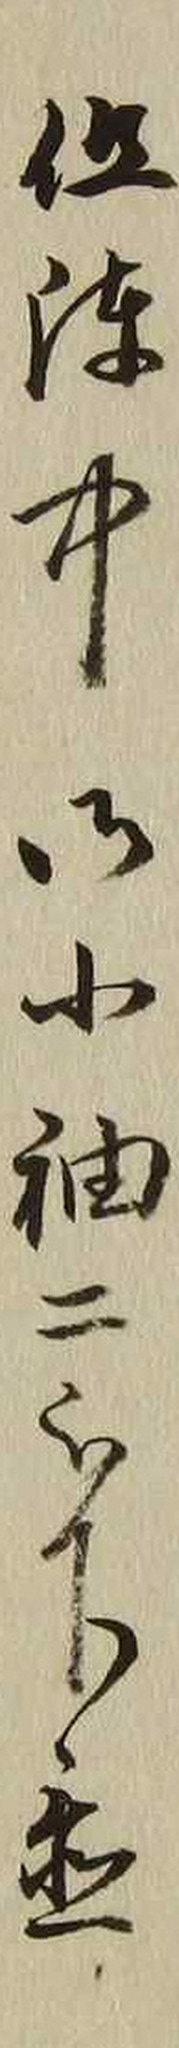但陣中御小袖二被下置
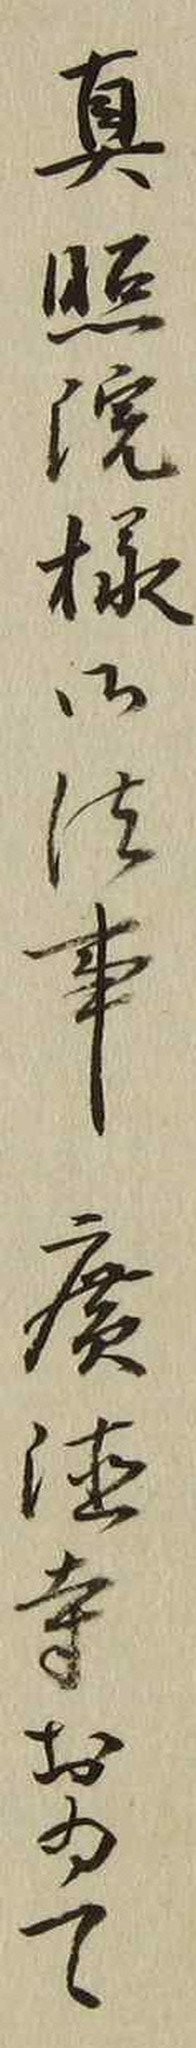真照院様御法事広徳寺おゐて
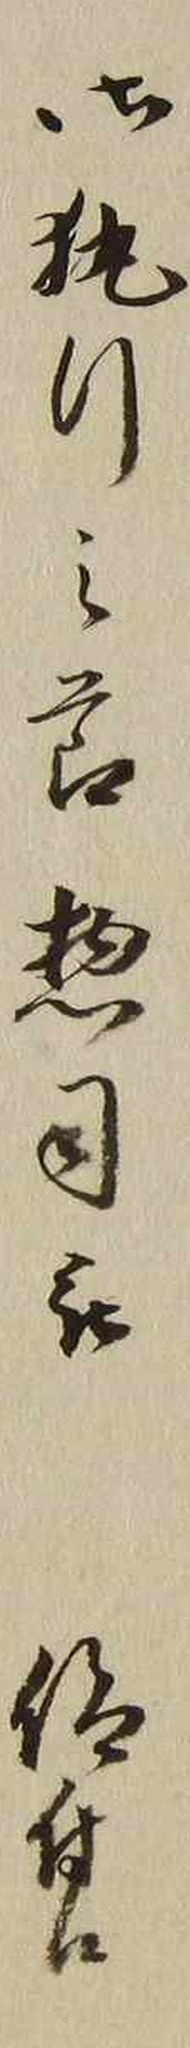御執行之節惣司被仰付候
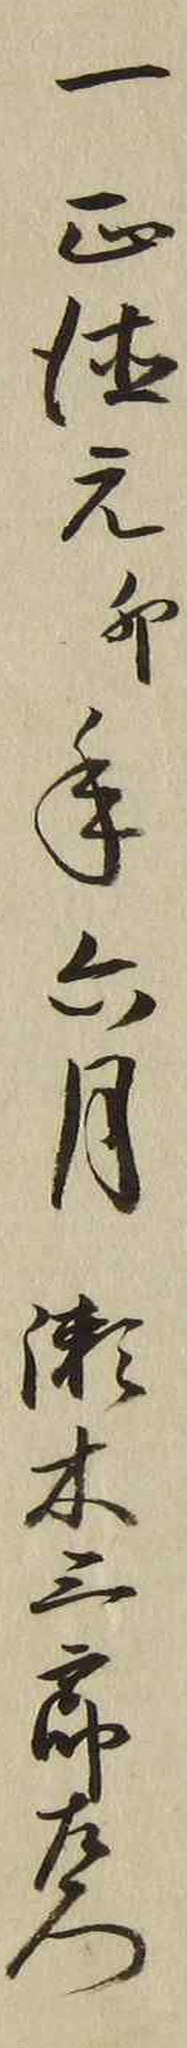一正徳元卯年六月瀬木三郎左衛門
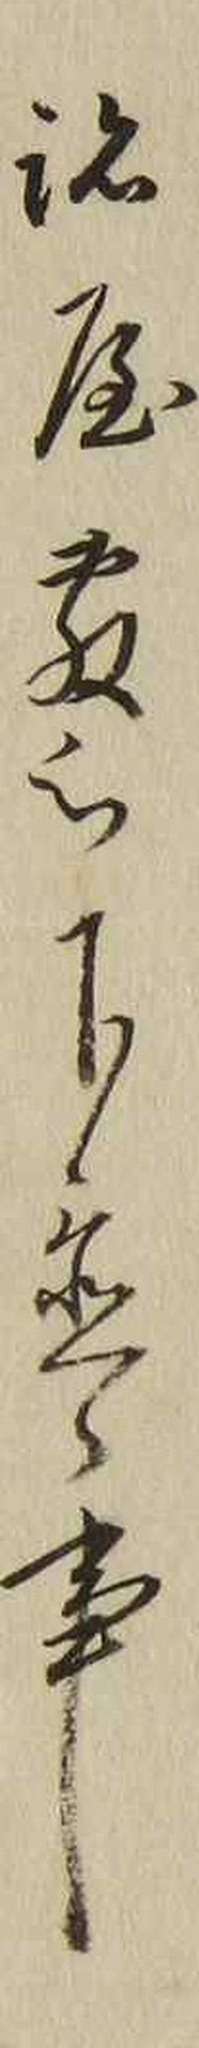跡屋敷被下置候事

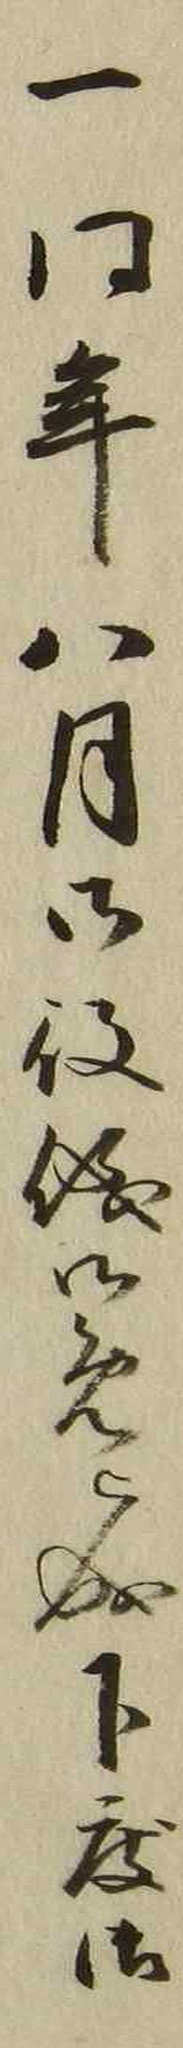一同年八月御役儀御免被成下度御
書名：諸士系譜　巻之69　を之部3
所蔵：会津若松市立会津図書館
